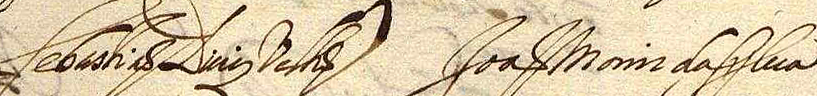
Sebastiaõ Diniz Velho Joaõ Moniz da Sylua
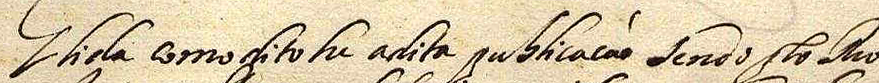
E lida como dito he a dita publicaçaõ sendo plo Reo
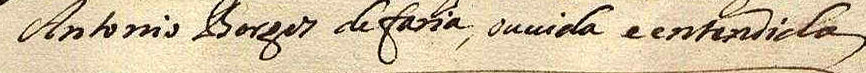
Antonio Borges de faria, ouuida e entendida
